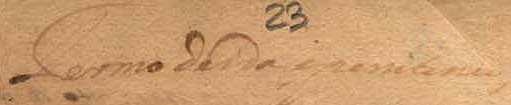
Termo de ida, e penitenca
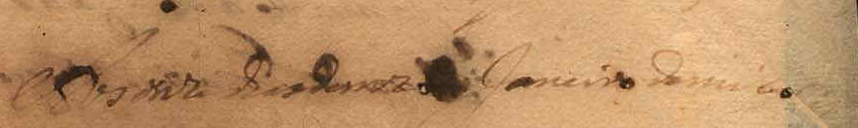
Aos onze dias do mez _ Janeiro de mil seis
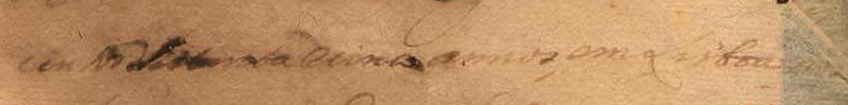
centos setenta e cinco annos, em Lisboa nos
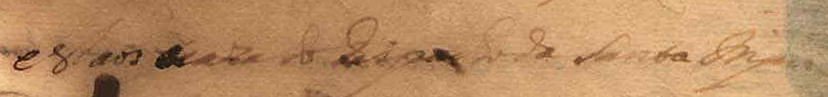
estaos e caza do despacho da santa Inqui
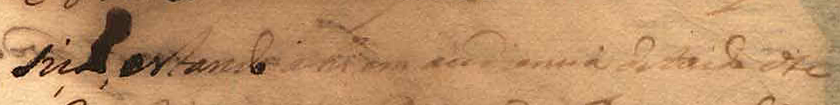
siçaõ, estando ahi em audiencia da tarde o se
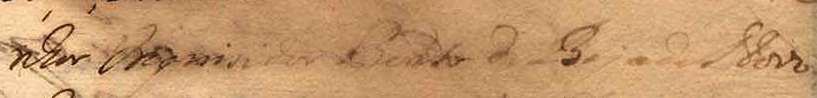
nhor Inquisidor Bento de Beja de Noro
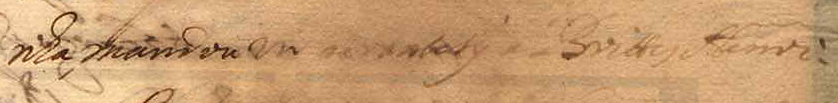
nha mandou perante sy a Brittes Henri
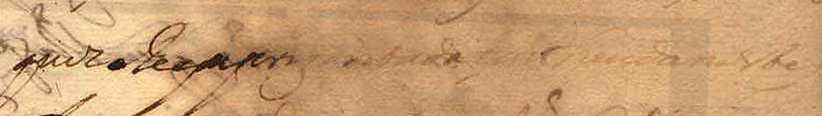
quez Re apprezentada, contheuda nestes
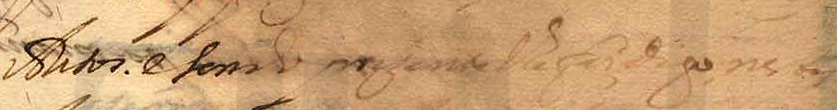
Autos. e sendo prezente lhe fez digo, nestes
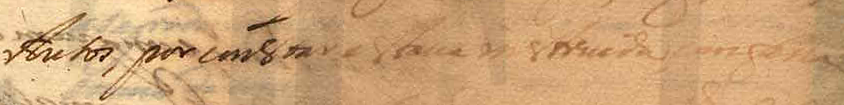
Autos, por constar estaua instruida, confessa
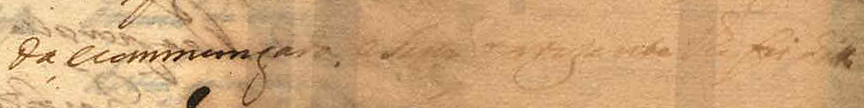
da, e commungada, e sendo prezente lhe foi ditto
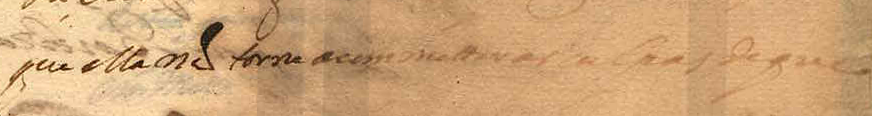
que ella naõ torne a commetter as culpas de que
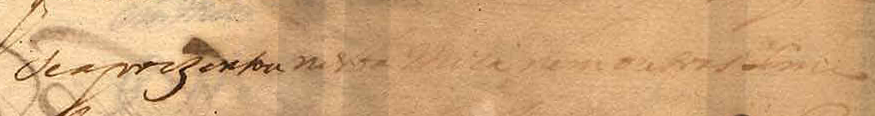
se aprezentou nesta meza nem outras seme
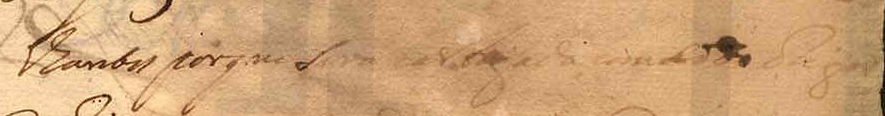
lhantes porque sera castigada com todo o Rigor
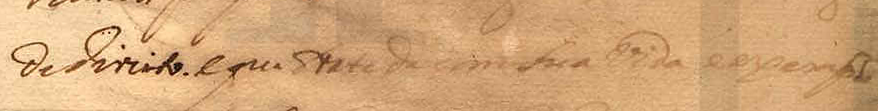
de direito. e que tratada com sua vida e exemplo
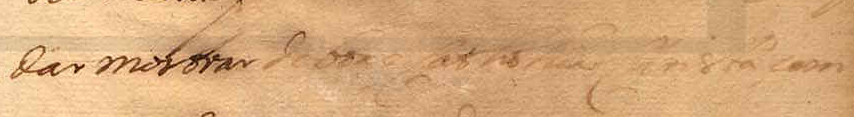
dar mostrar de boa e Catholica Christã, com
